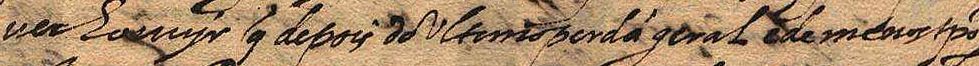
uer E ouujr q̄ depois do vltimo perdā geral e de menos tpō
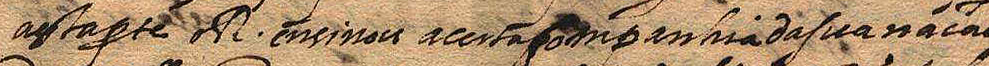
a esta pte o R. ensinou a certa Companhia da sua nação
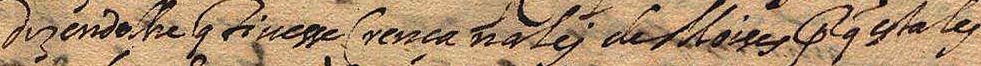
dizendolhe q̄ tiuesse Crença na Lej de Moises p̄ q̄ esta lej
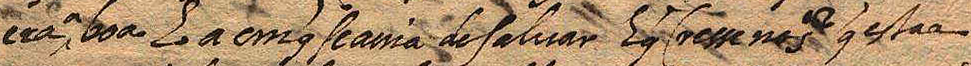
era a boa E a em q̄ se auia de saluar E q̄ Cresse no sor q̄ estaa
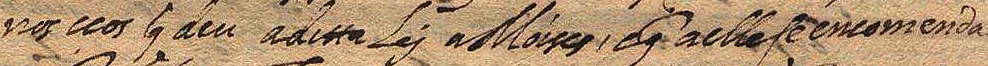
nos ceos q̄ deu a ditta Lej a Moises, e q̄ a elle se encomenda
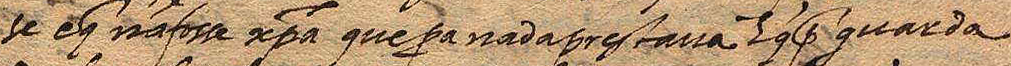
se e q̄ nā fosse xpā que ꝑa nada prestaua E q̄ p̄ guarda
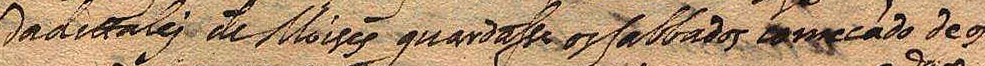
da ditta lej de Moises guardasse os sabbados começādo de os
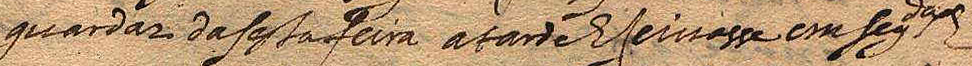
guardar da sesta feira a tarde E Jeiuasse em segdas E
